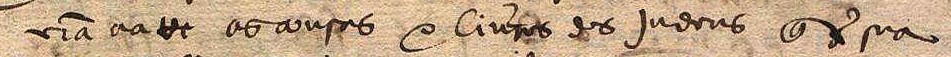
erā aa Re as cousas e liuros dos Judeus q̄ ē sua
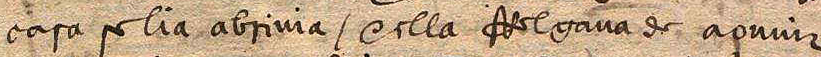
casa se lia a briuia / e ella ffolgaua de a ouuir
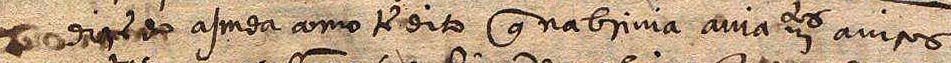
dizēdo aJmda como tē dito q̄ na briuia auia mtos auisos
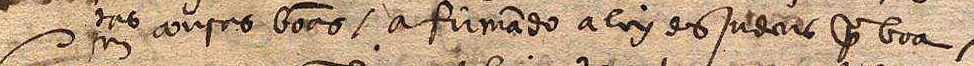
e mtas cousas bōas / afirmādo a ley dos Judeus p̄o boa /
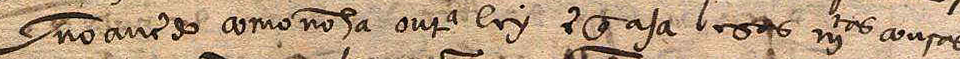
n̄o auēdo como n̄o ha outa ley ē q̄ aja esas mtas cousas
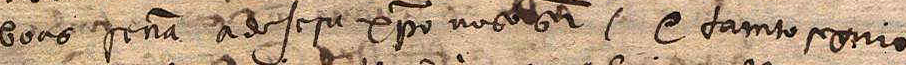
boas senā a de Jesu xp̄o noso s̄or / e tamto seguio
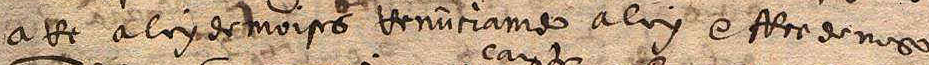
a Re a ley de moises Renūciamdo a ley e ffee de noso
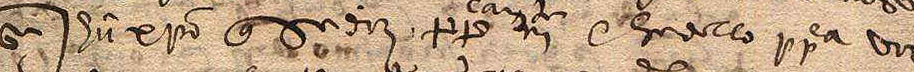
s̄or Jhū xpō q̄ se diz ppcamte e he dello ppca voz
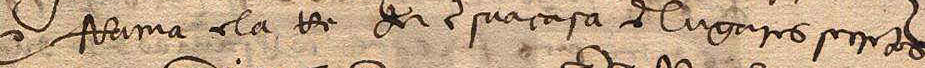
e ffama ela Re ter ē sua casa ē lugares secretos
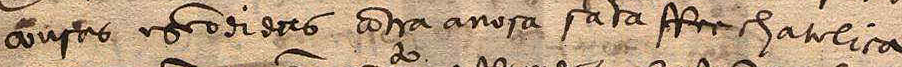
cousas esc̄odidas c̄otra a nosa sāta ffee chatolica
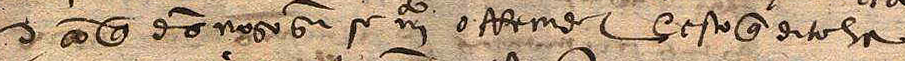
e c̄o q̄ ds̄ noso s̄or se mto offemde / e esto q̄ dito he
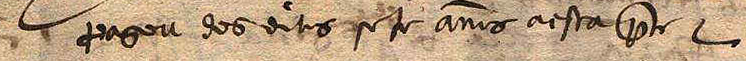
pasou dos ditos sete an̄os a esta p̄te /
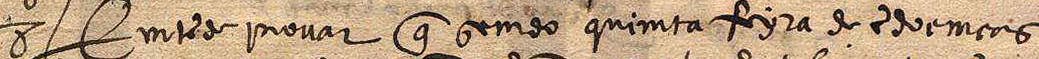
8o / Emtēde prouar q̄ semdo quimta feyra de ēdoemças
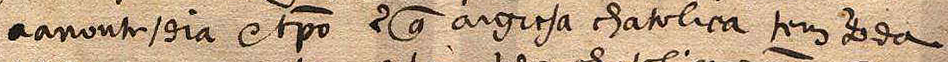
aa noute / dia e tp̄o ē q̄ a igreJa chatolica tem toda
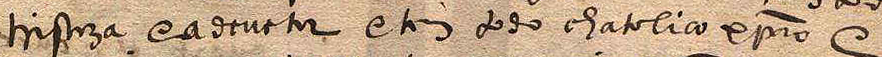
tristeza e a deue ter e tem todo chatolico xpão e
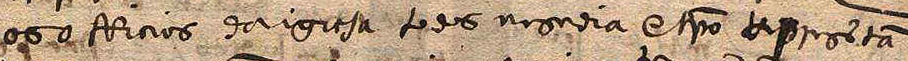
os officios da igreJa todos nese dia e tp̄o Represētā
